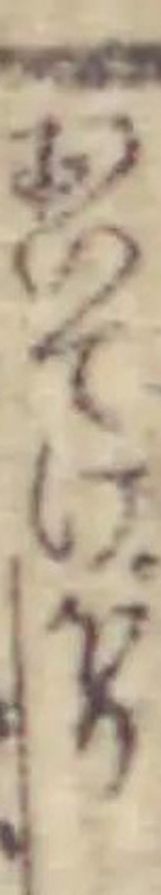おいてけぼり
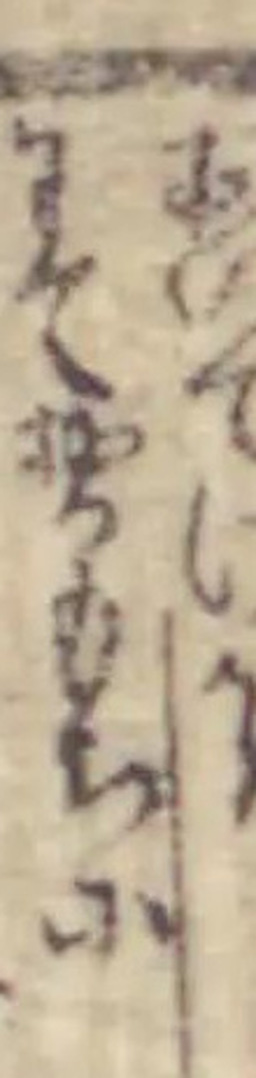にておかもちに
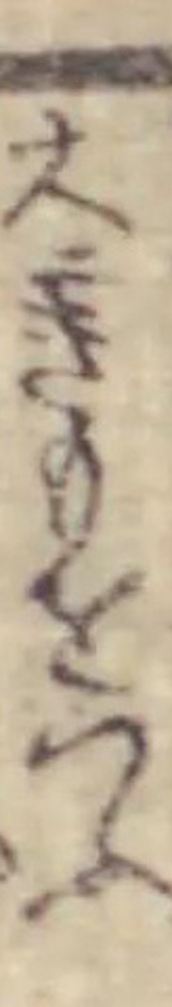大ニきもをつふ
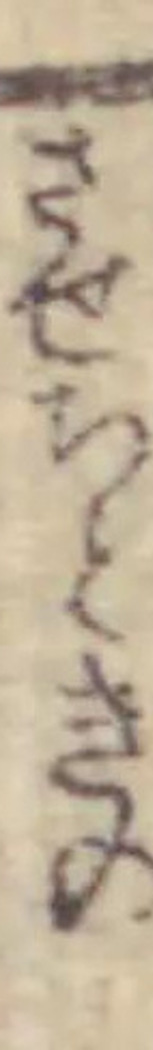させちときの
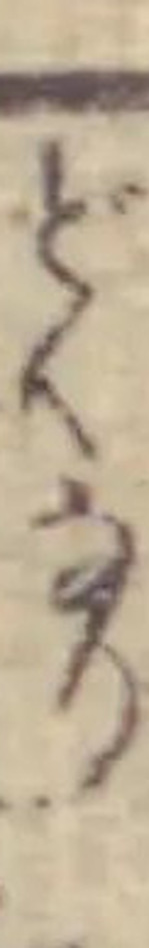どくなり
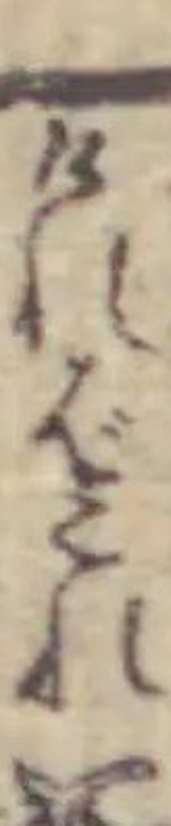ければこれ
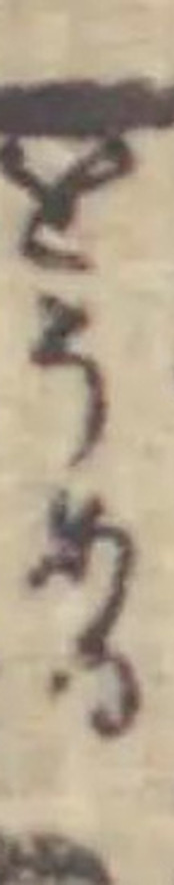をうめる
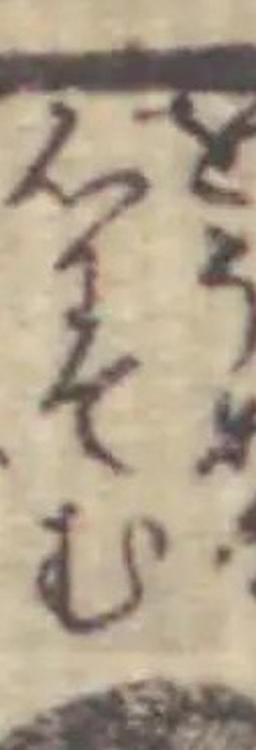心にてむ
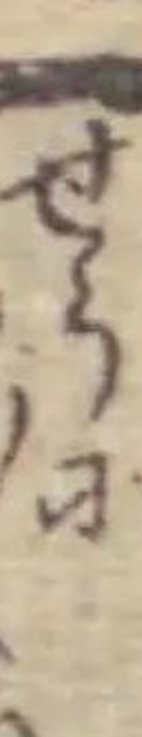せうに
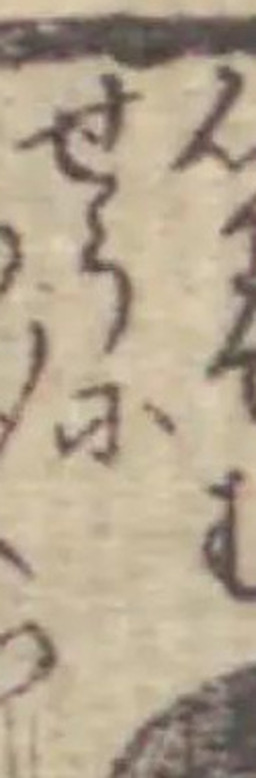せうに
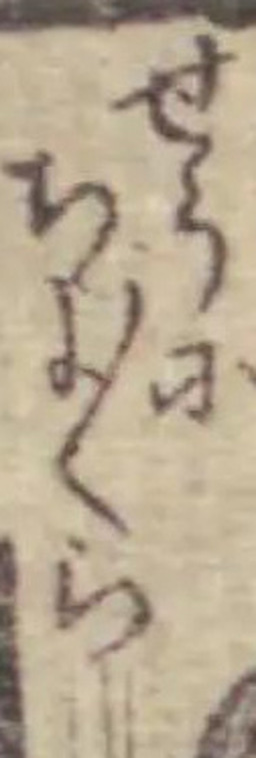ちよ〳〵ら
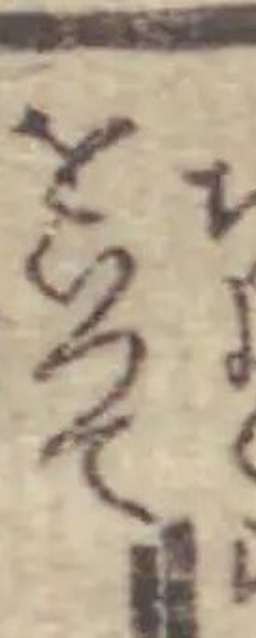をいつて
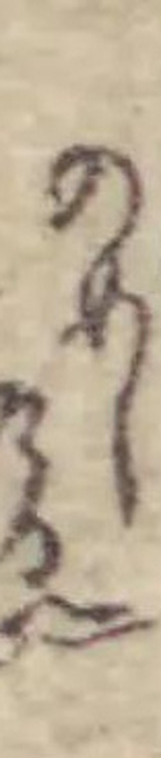のめし
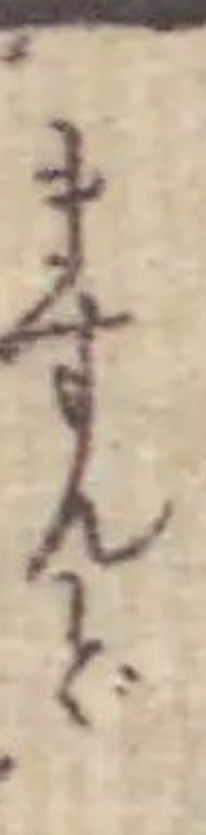ますんど
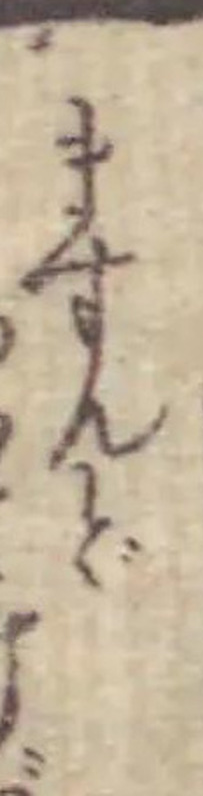ますんど
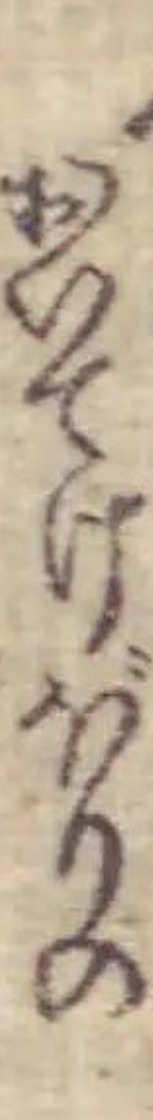おいてけぼりの
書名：亀山人家妖 3巻
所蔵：国立国会図書館 National Diet Library, JAPAN
